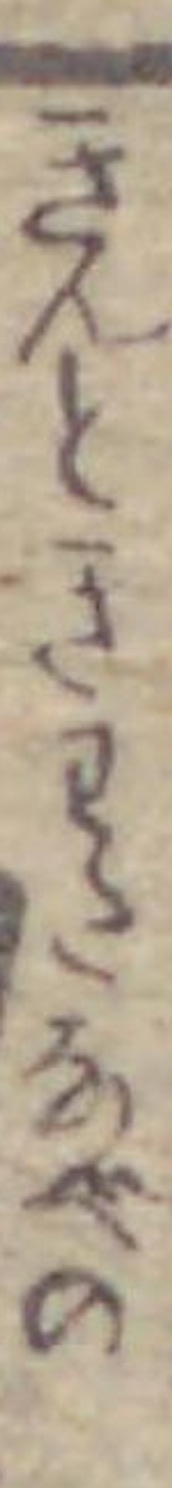きんときわたなべの
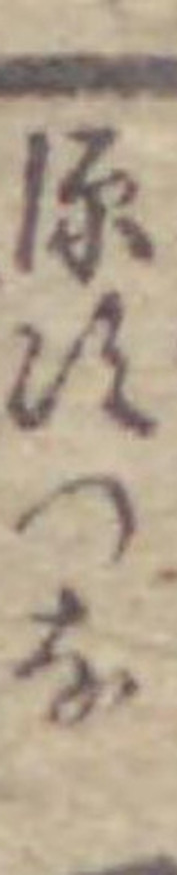源次つな
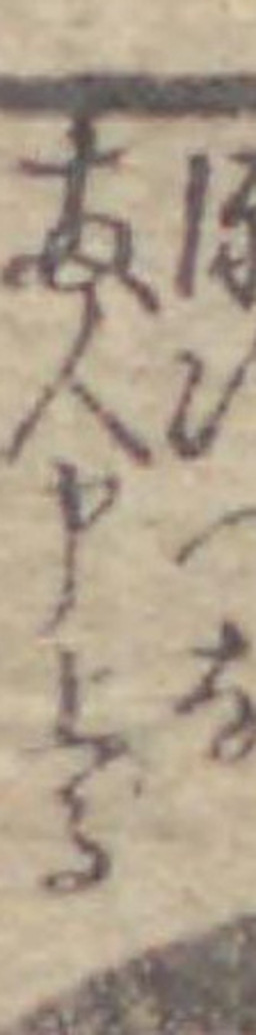両人申上る
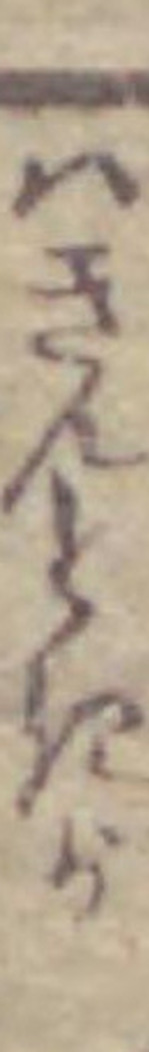はきんときが
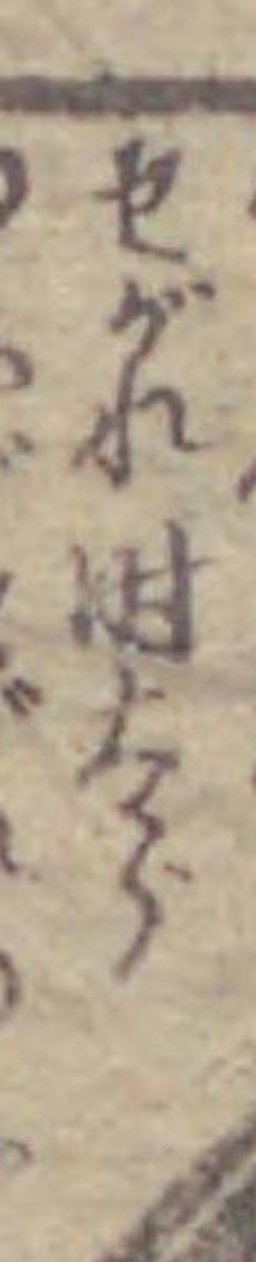せがれ時太郎
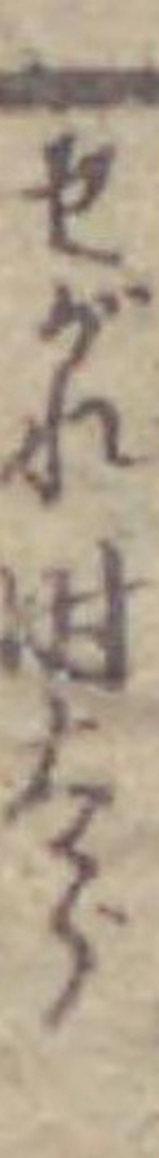せがれ時太郎
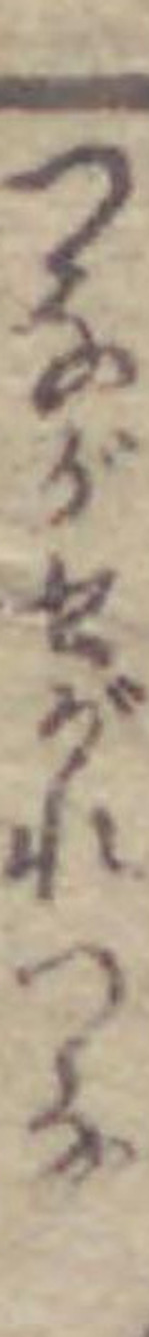つながせがれつな
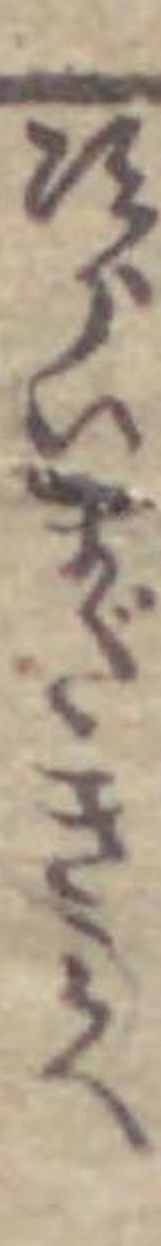次郎いまだきみへ
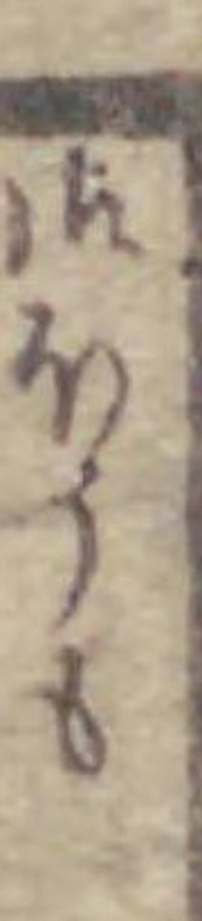御ほうも
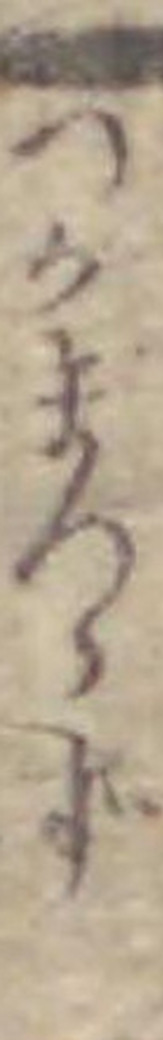つかまつらず
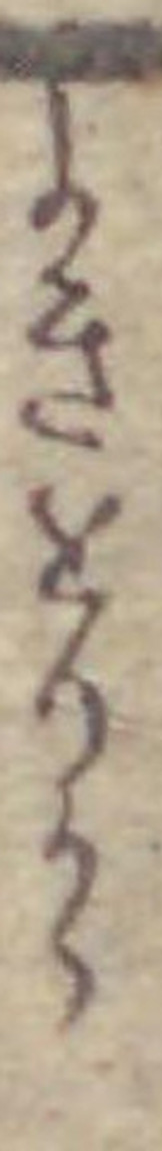よきをりから
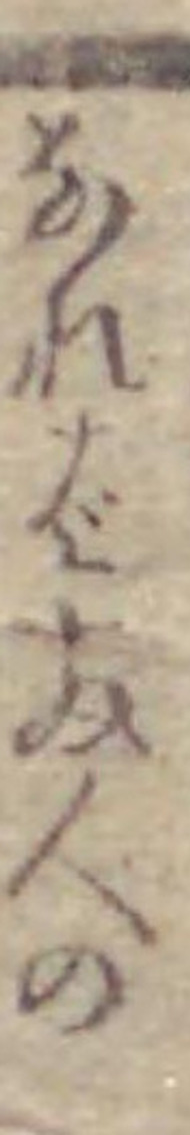なれば両人の
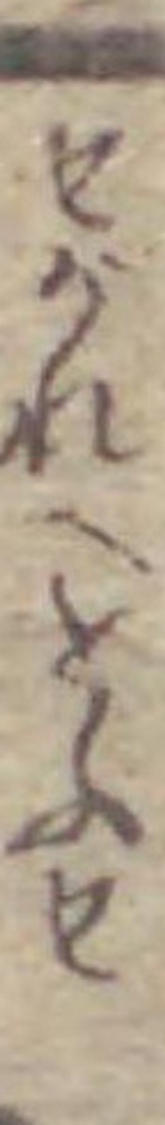せがれへをふせ
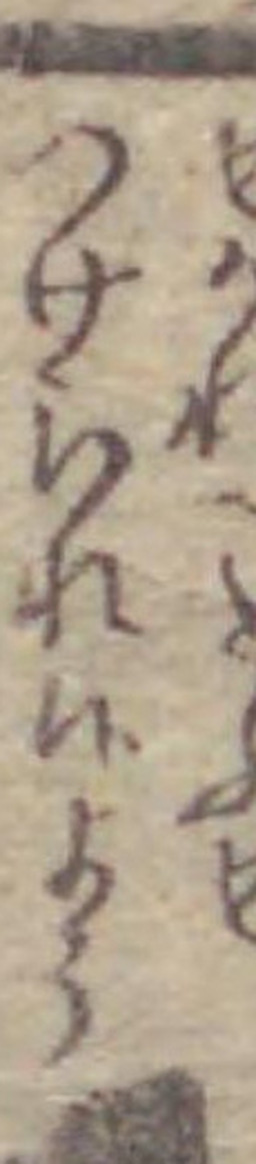つけられ候よう
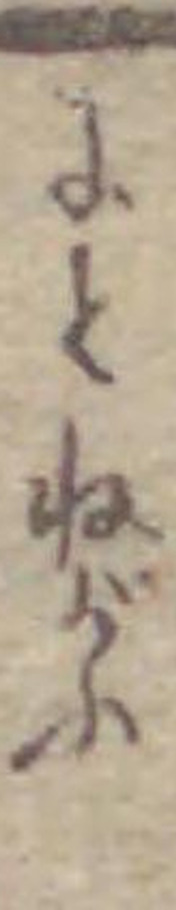にとねがふ
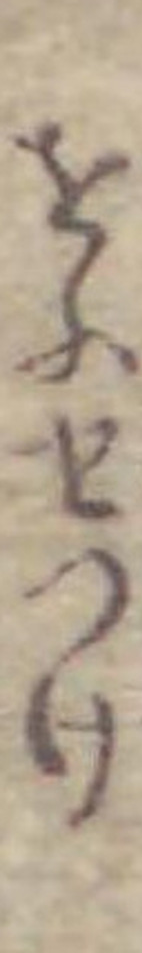をふせつけ
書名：二日替 : 2巻
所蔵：国立国会図書館 National Diet Library, JAPAN
